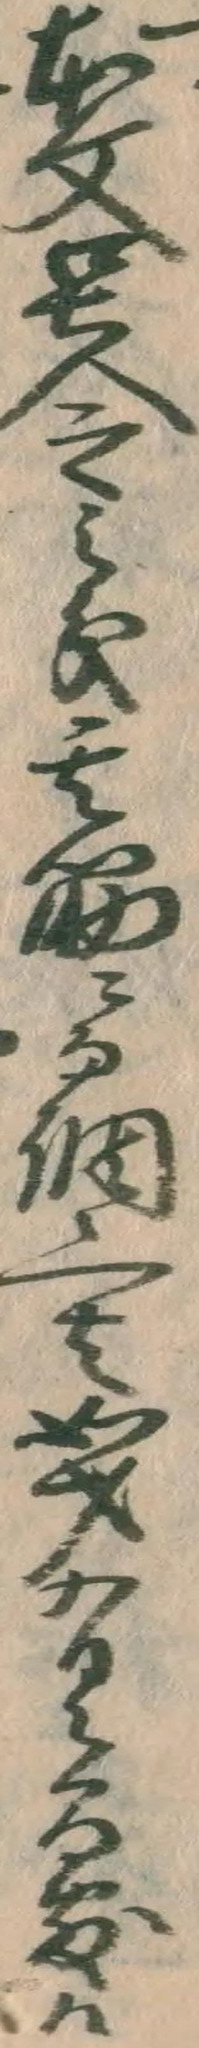本文号令之義其筋二而調候へ者如才有之間敷候
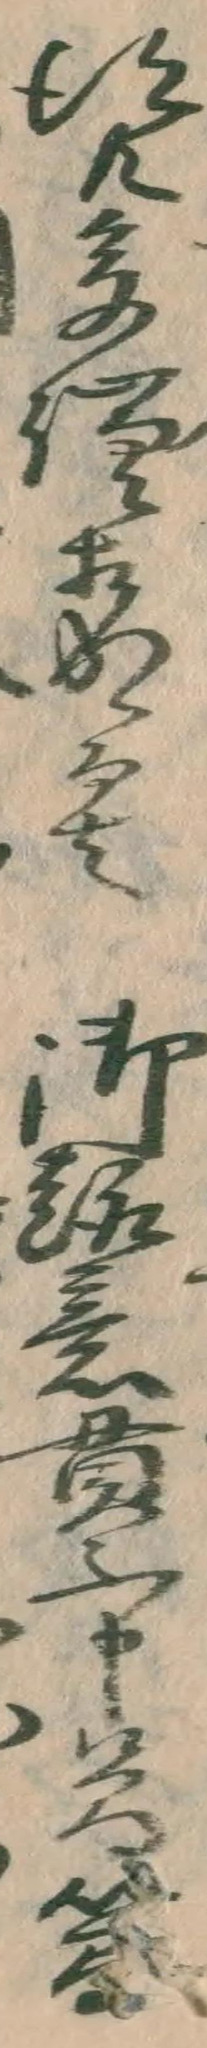得共多端ニ相成候而者御趣意貫不申候間簡
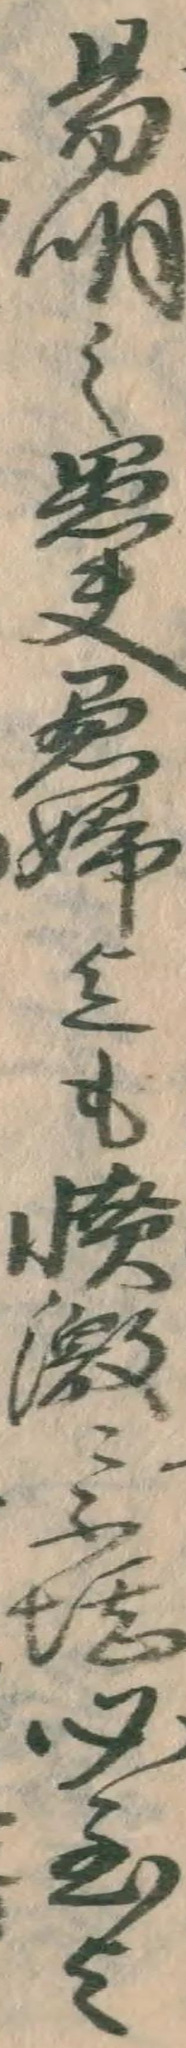易明之愚夫愚婦迄も憤激ニ不堪必至と
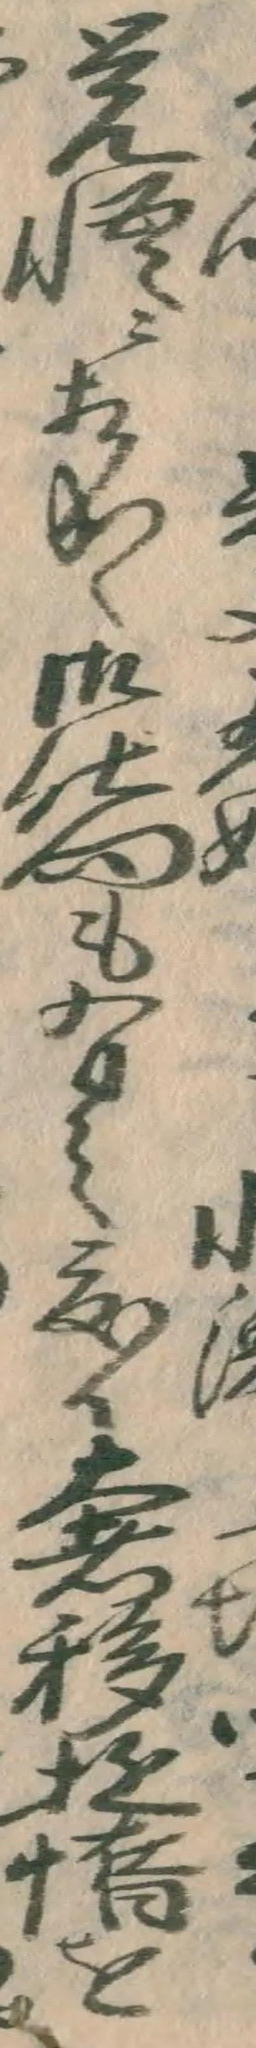覚悟ニ相成候御仕向も有之度候奢移遊惰を
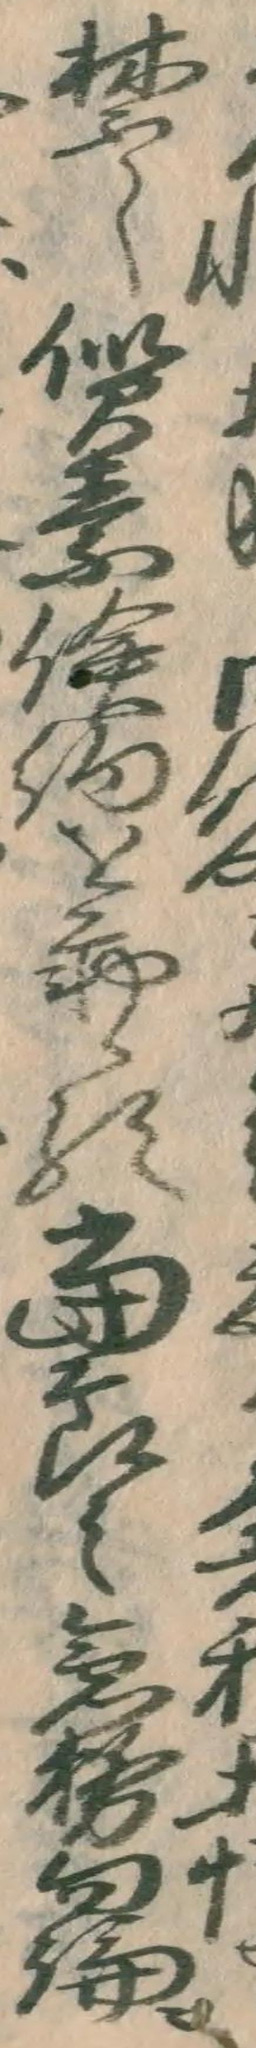禁し質素倹約を勤候類當節之急務勿論ニ
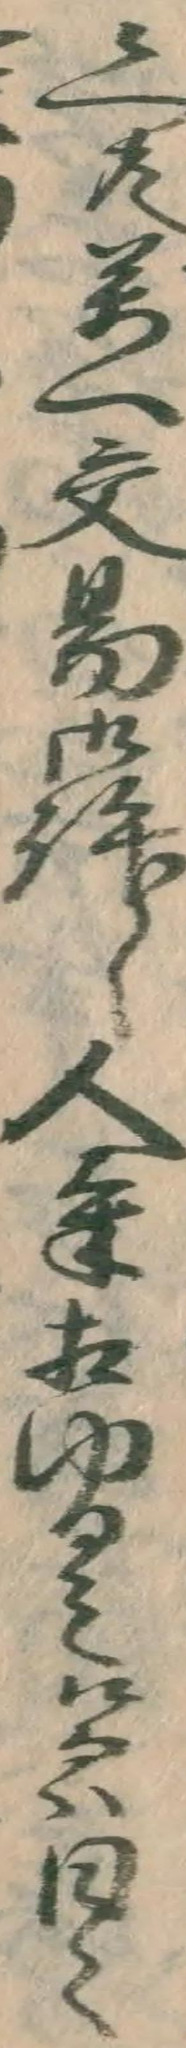候へ共萬一交易御許し人氣相ゆるミ候而ハ日々
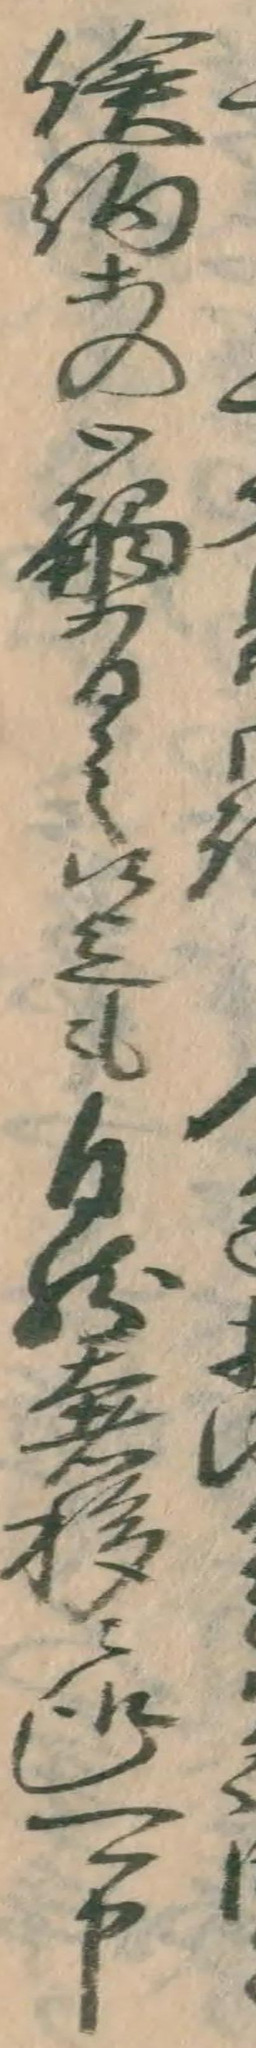倹約等の御觸有之候迄も自然奢移ニ趣可申

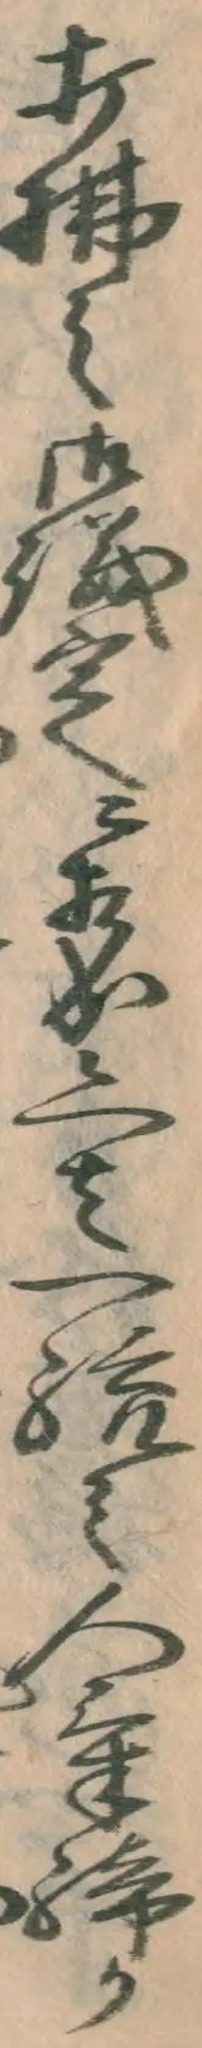打拂之御議定ニ相成候へ者一統之人氣締り
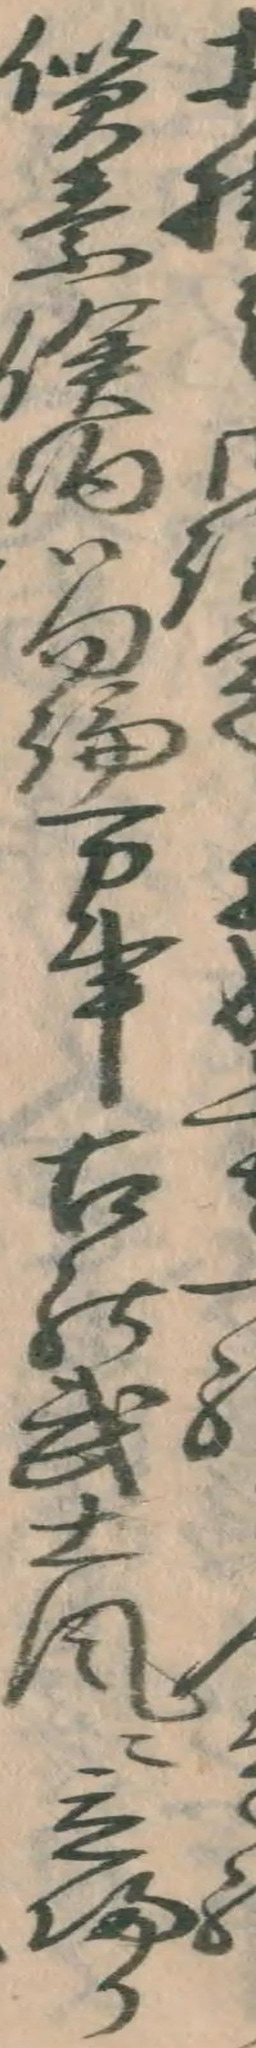質素倹約ハ勿論万事古の武士風ニ立帰り
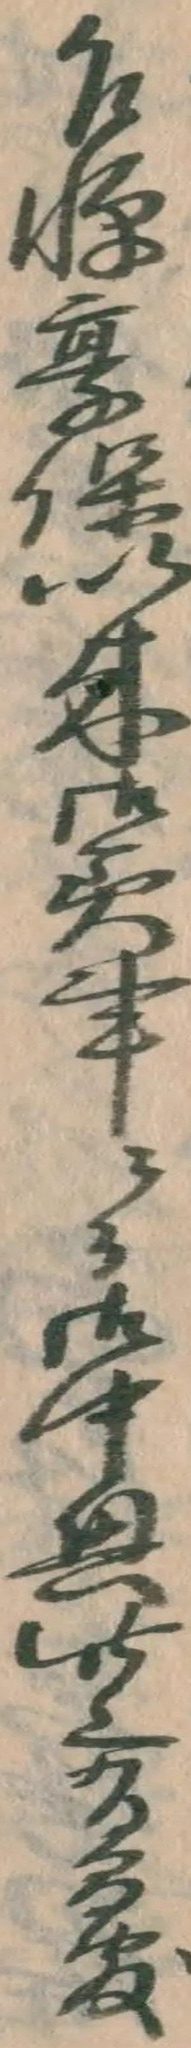乍憚享保以来御美事ニ而御中興此上有間敷
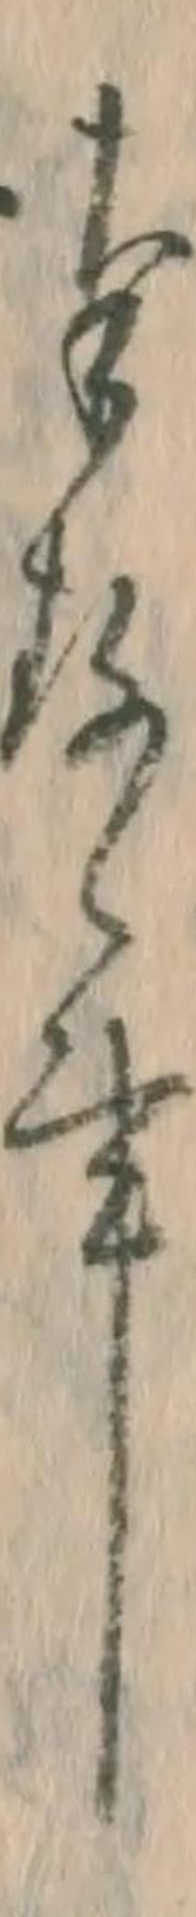奉存候事
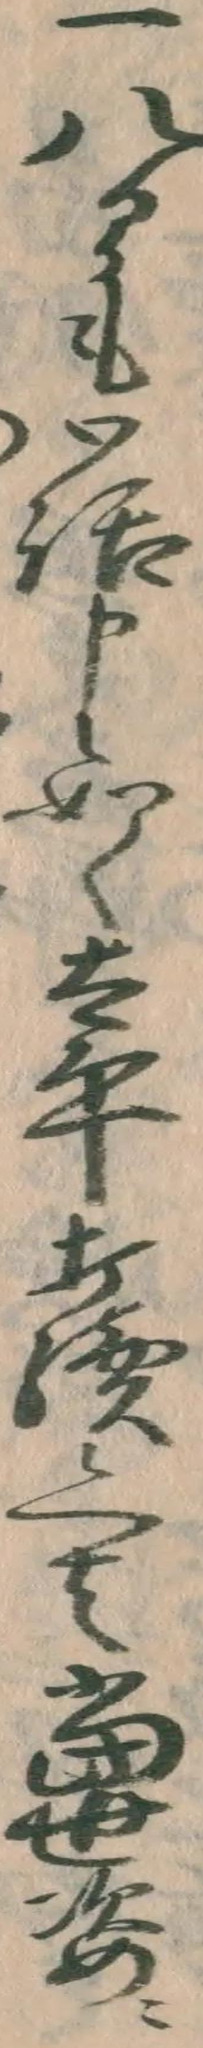一八日にも御話申候如く太平打續候へ者當世姿ニ
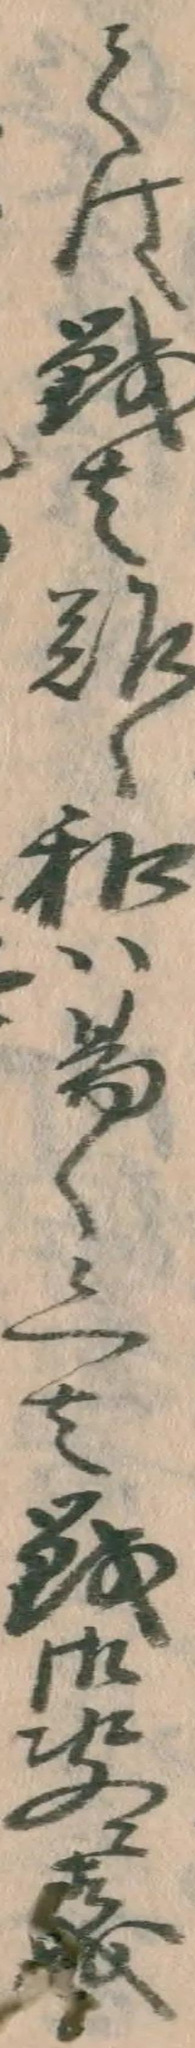ては戦者難く和ハ易く候へ者戦御決ニ相成
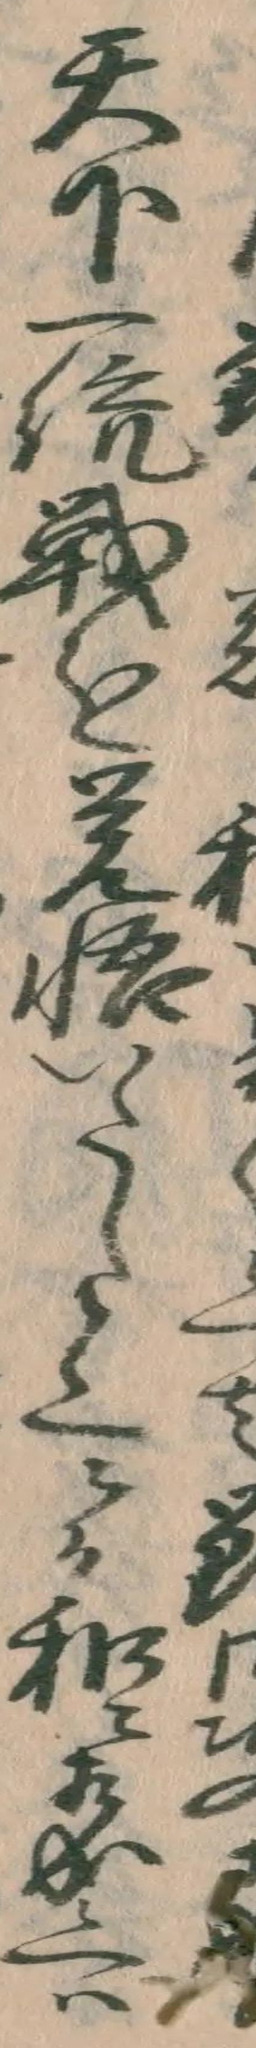天下一統戦を覚悟いたし候上ニ而和ニ相成候へハ
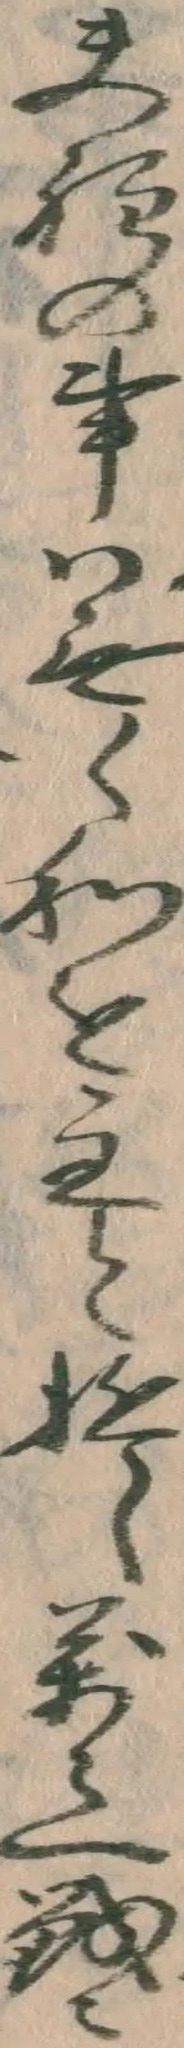夫程の事ハ無く和を主と遊し萬々一戦ニ
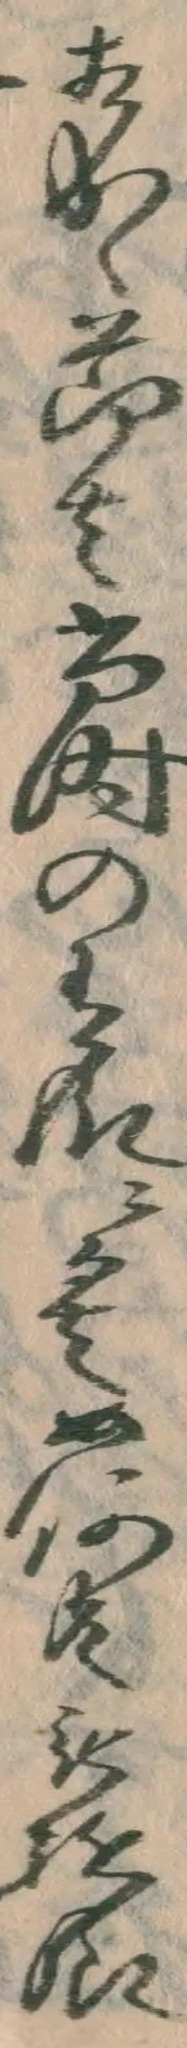相成候節者當時の有様ニ而者如何共被遊様
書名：麗斎叢書. 20
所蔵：国立国会図書館 National Diet Library, JAPAN
